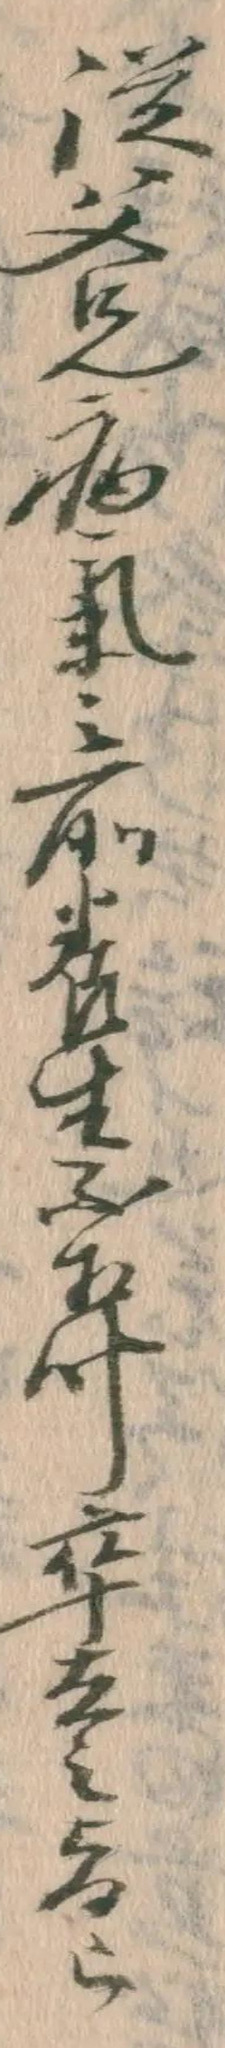従父兄病氣之所養生不相叶卒去之旨被
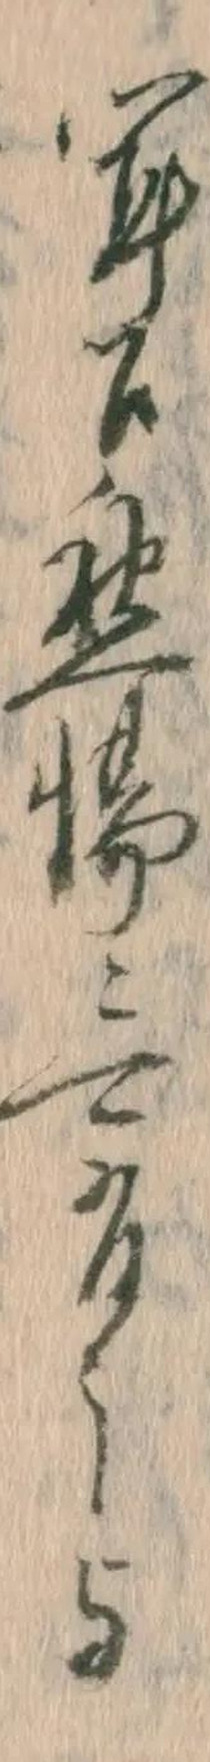聞召愁傷ニ可有也与
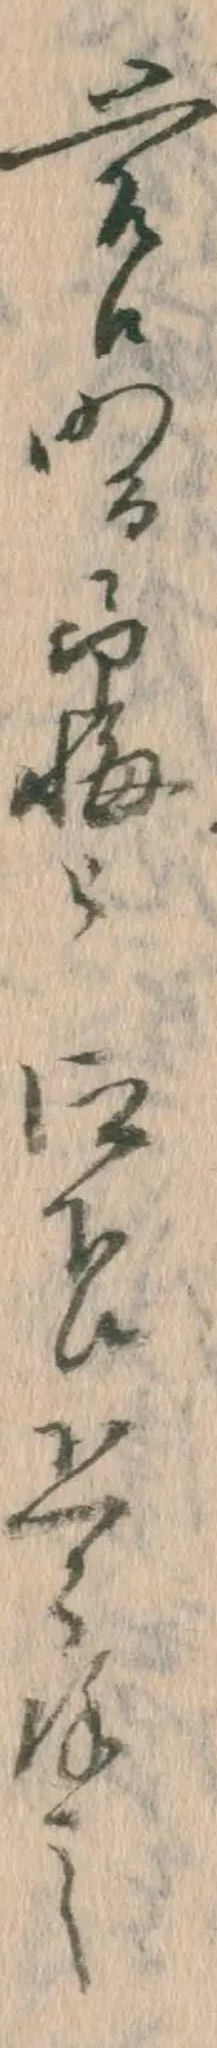思召候仍而弔悔被仰下候恐々余也
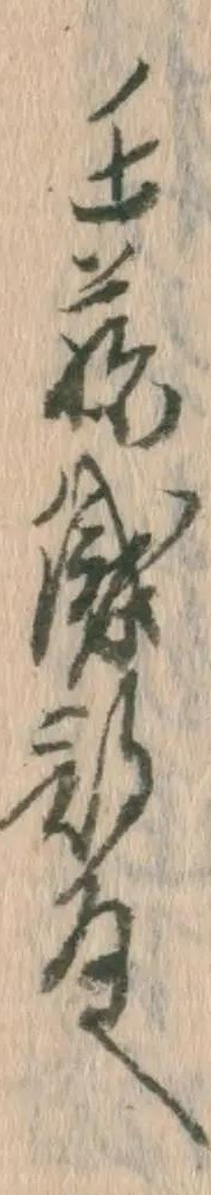近藤織部様
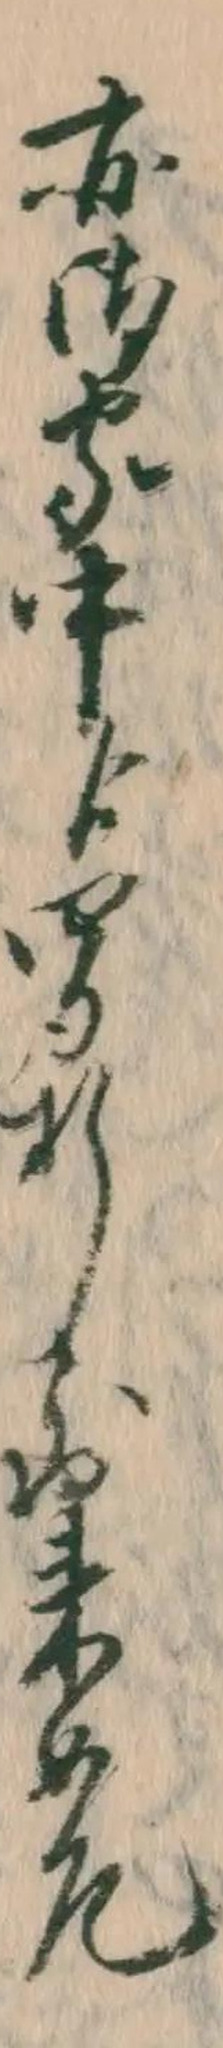亦御家中ゟ四ツ折到来如左
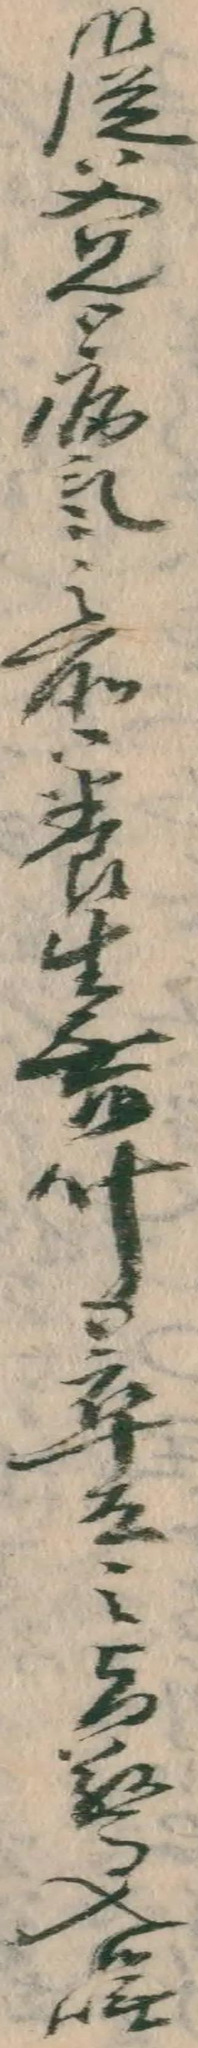御従父兄御病気之所御養生無御叶御卒去之旨難御入候唯
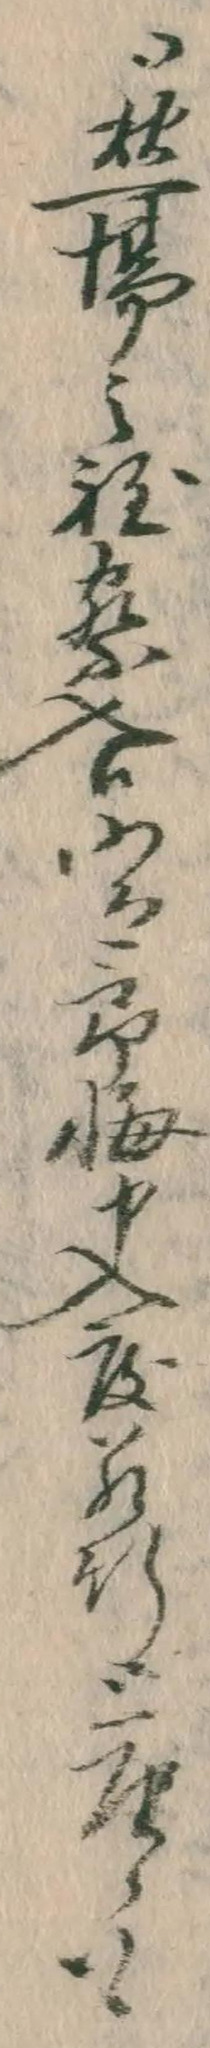御愁場之程察入候仍而御弔悔申入度罷行御座候以上
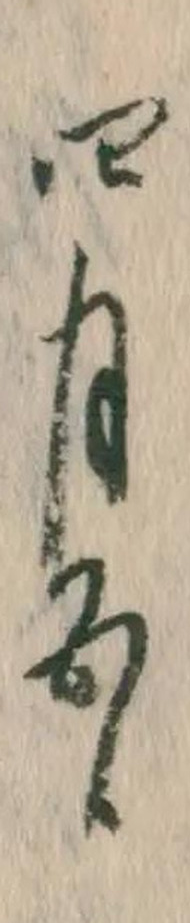四月五日
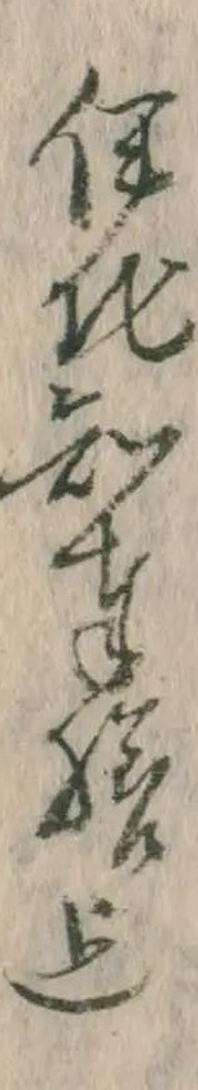伊地知奉膳迄
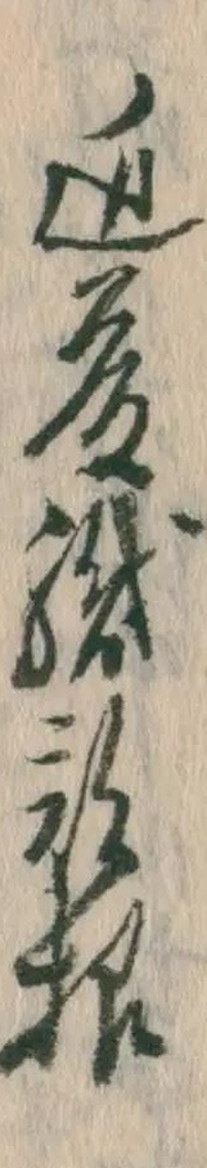近藤織部様
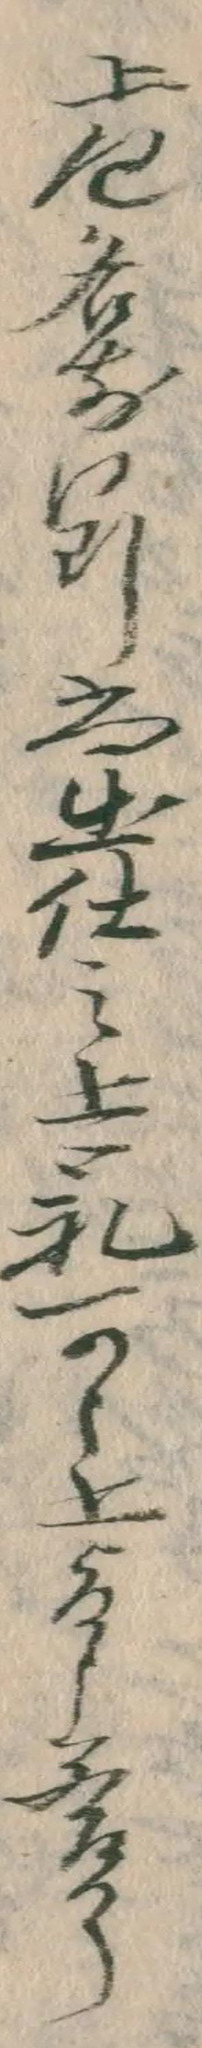上包名前同断尚出仕之上御礼可申上旨申答了
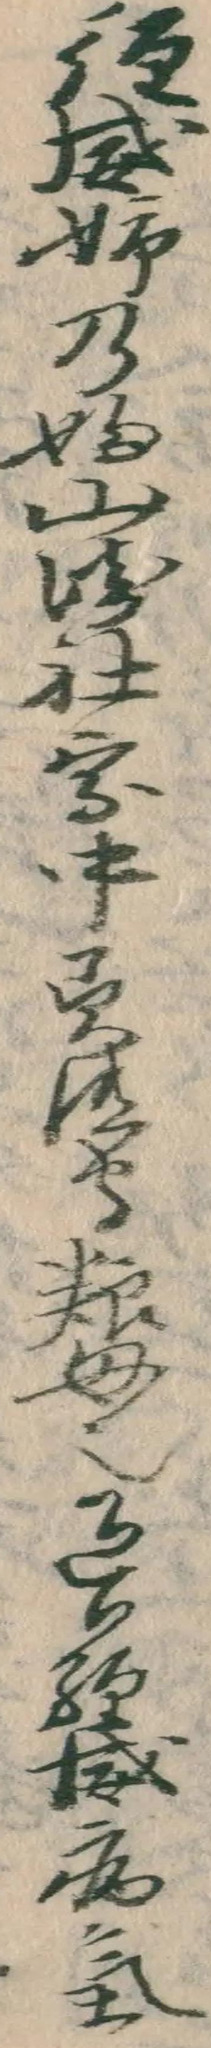経威姉乃婦山崎社家中美濃守養母也過日経威病氣
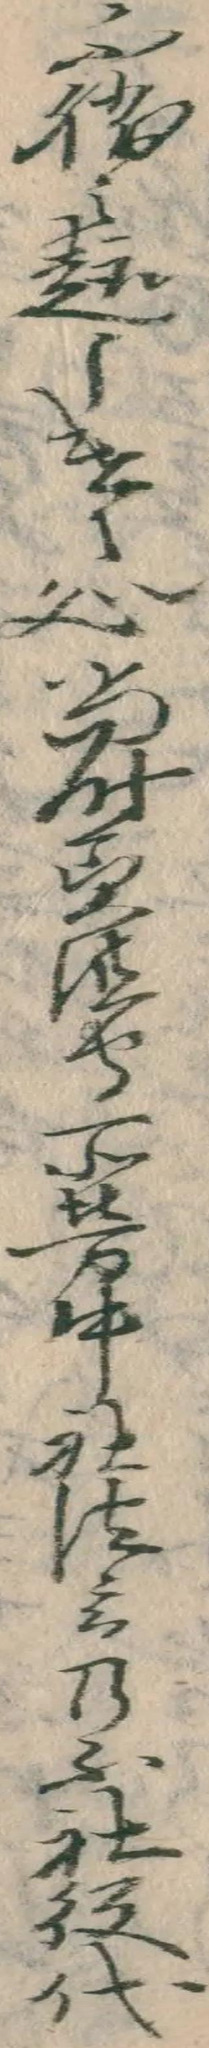不勝之趣申遣候処當時美濃守所労中社法ニ而乃不社役代
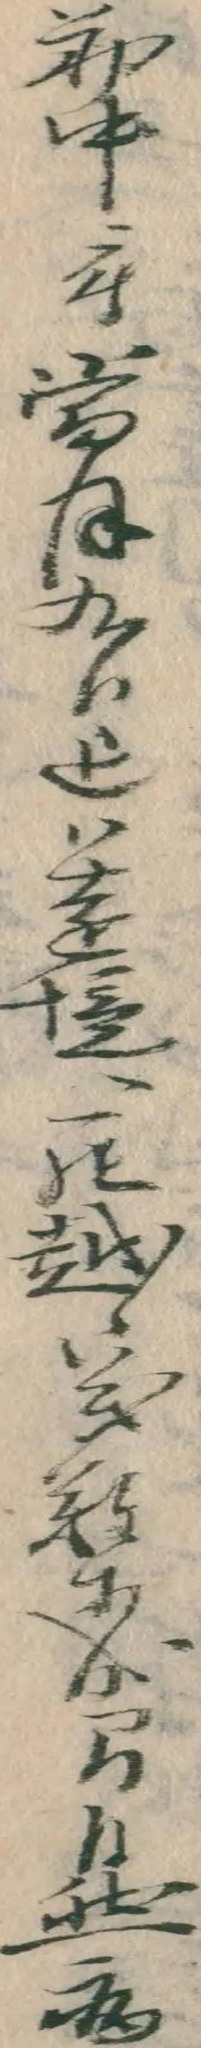勤中ニ付當月九日迄御遠境ヘ罷越候義難相成間自然病
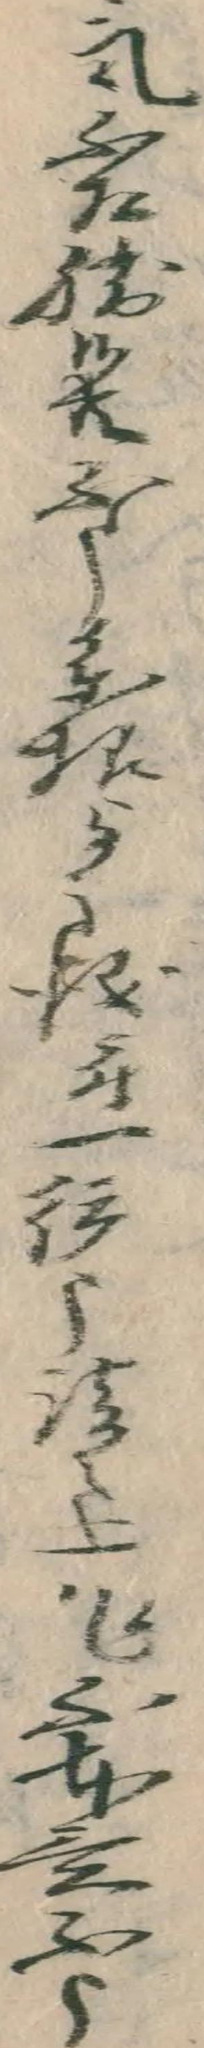氣不相残候共不申参様与不儀ニ付一統申談之不本意不申
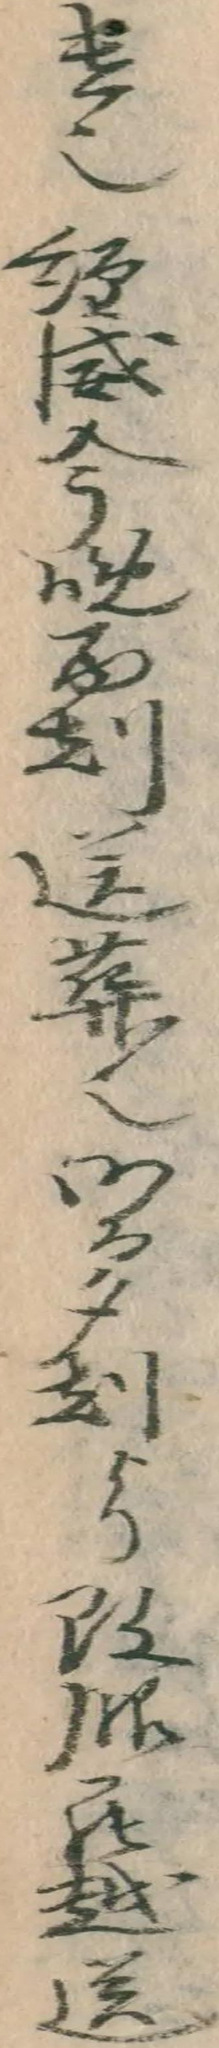遣也経威今晩酉刻送葬也仍而夕刻より改服罷越送
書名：賀茂社記録. 第69冊
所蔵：国立国会図書館 National Diet Library, JAPAN
